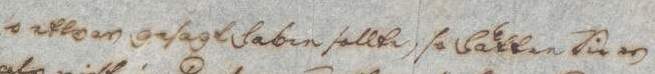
so etwas gesagt haben sollte, so hätten Sie es
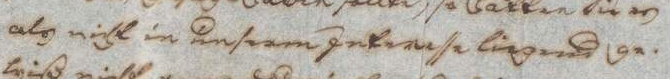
als nicht in unserm Interesse liegend ge-
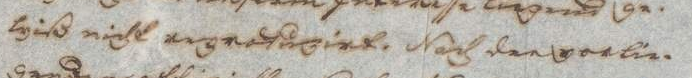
wiß nicht reproduzirt. Nach den vorlie-
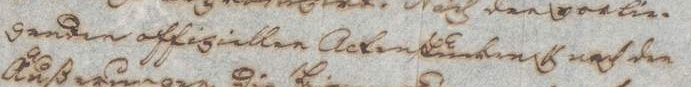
genden offiziellen Actenstücken & nach den
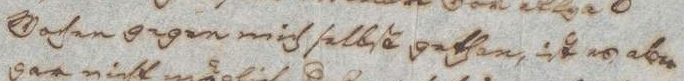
Wochen gegen mich selbst gethan, ist es aber
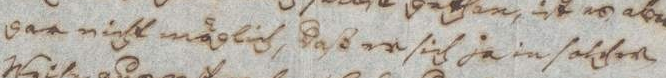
gar nicht möglich, daß er sich je in solcher
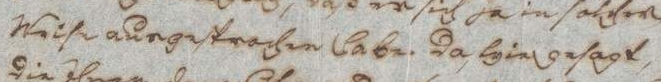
Weise ausgesprochen habe. Da, wie gesagt,
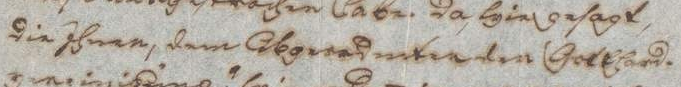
die Ihnen, dem Abgeordneten der Gotthard -
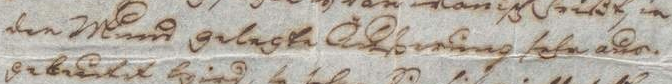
den Mund gelegte Äußerung sehr aus-
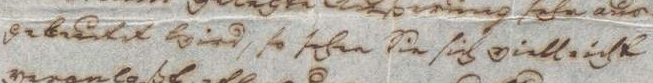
gebeutet wird, so sehen Sie sich vielleicht
